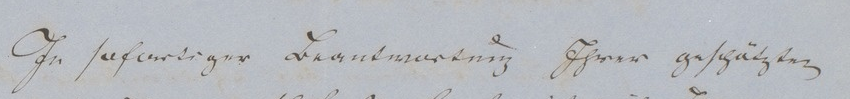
In sofortiger Beantwortung Ihrer geschätzten
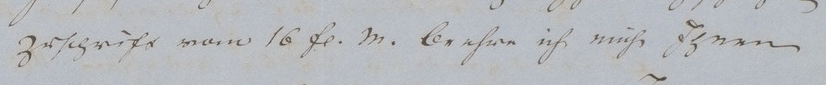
Zuschrift vom 16. fl. M. beehre ich mich Ihnen
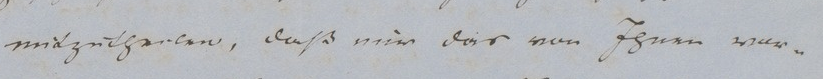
mitzutheilen, daß mir das von Ihnen vor-
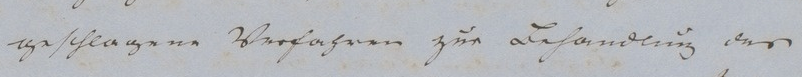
geschlagene Verfahren zur Behandlung des
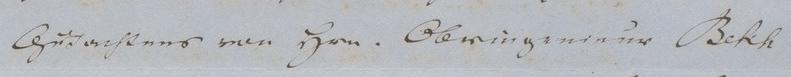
Gutachtens von Hrn. Oberingenieur Bekh
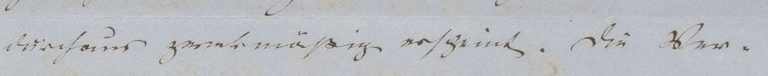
durchaus zwekmäßig erscheint. Die Ver-
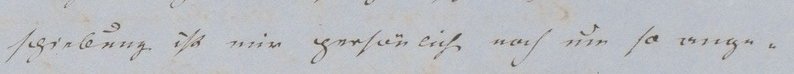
schiebung ist mir persönlich noch um so ange-
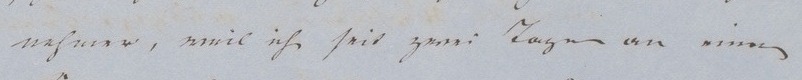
nehmer, weil ich seit zwei Tagen an einem
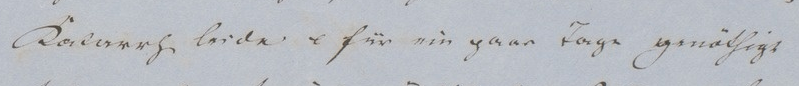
Katarrh leide & für ein paar Tage genöthigt
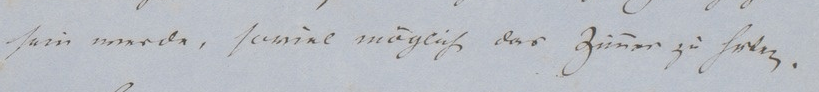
sein werde, soviel möglich das Zimmer zu hüten.
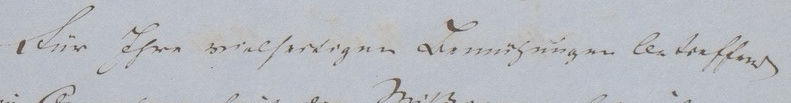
Für Ihre vielseitigen Bemühungen betreffend
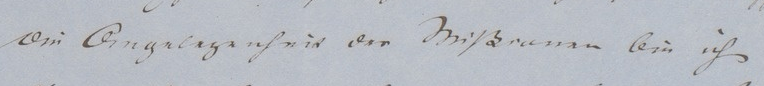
die Angelegenheit der Mißionen bin ich
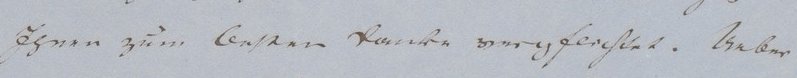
Ihnen zum besten Danke verpflichtet. Ueber
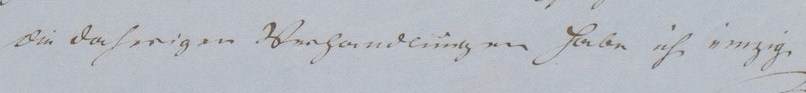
die daherigen Verhandlungen habe ich einzig
